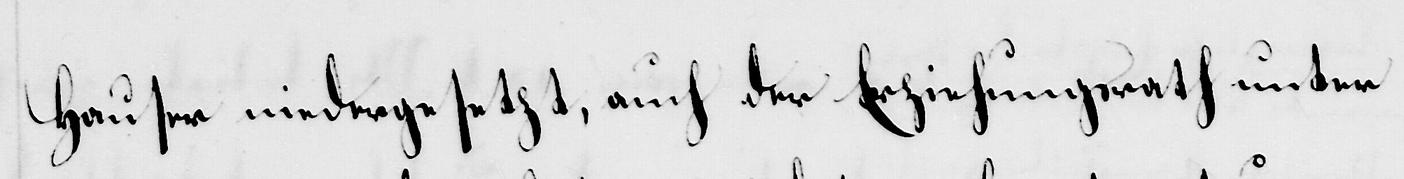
Hauser niedergesetzt, auch der Erziehungsrath unter
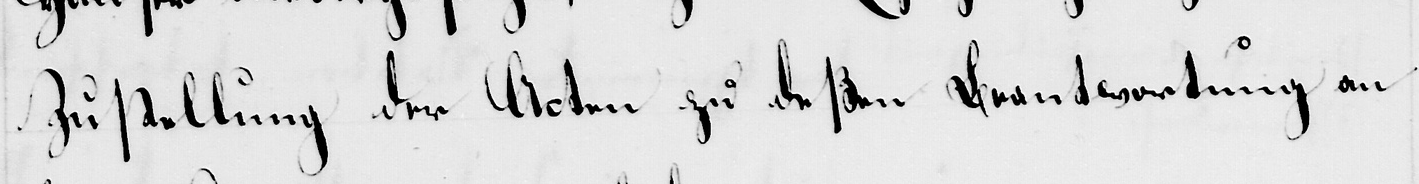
Zustellung der Acten zu deßen Beantwortung an
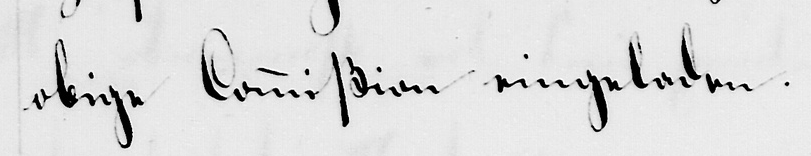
obige Commißion eingeladen.
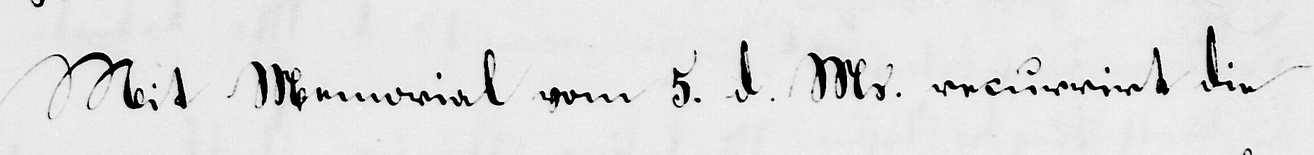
Mit Memorial vom 5. d. Ms. recurrirt die
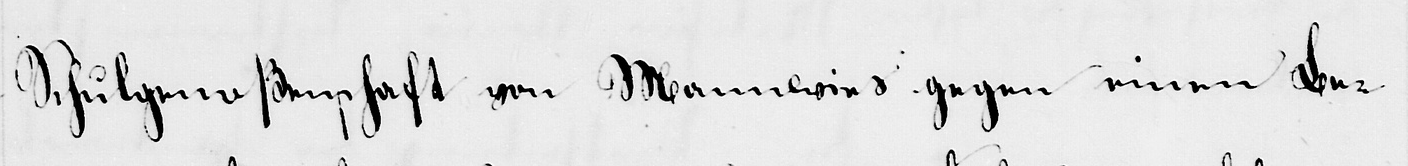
Schulgenoßenschaft von Mannwies gegen einen Be¬
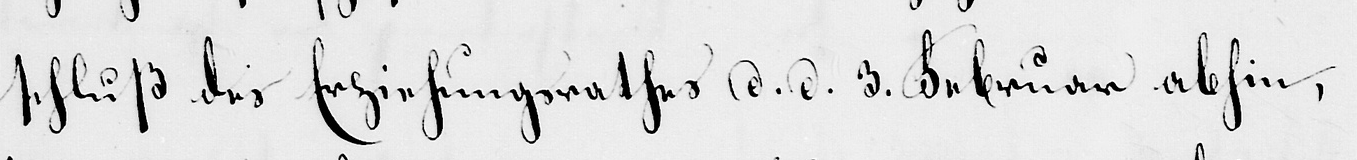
schluß des Erziehungsrathes d. d. 3. Februar abhin,
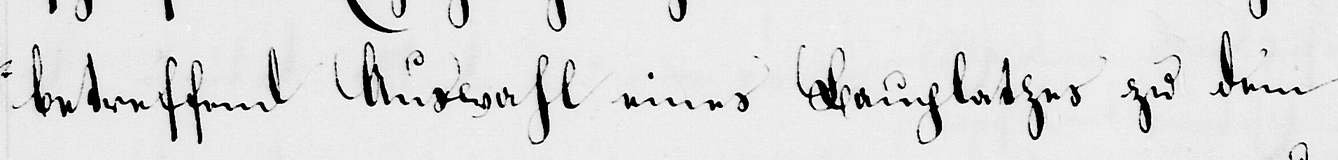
betreffend Auswahl eines Bauplatzes zu dem
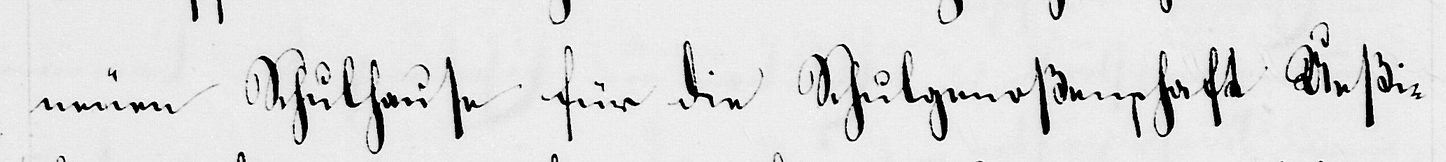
neuen Schulhause für die Schulgenoßenschaft Ueßi¬
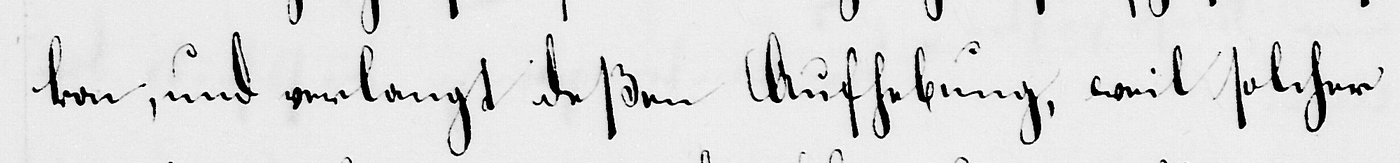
kon, und verlangt deßen Aufhebung, weil solcher
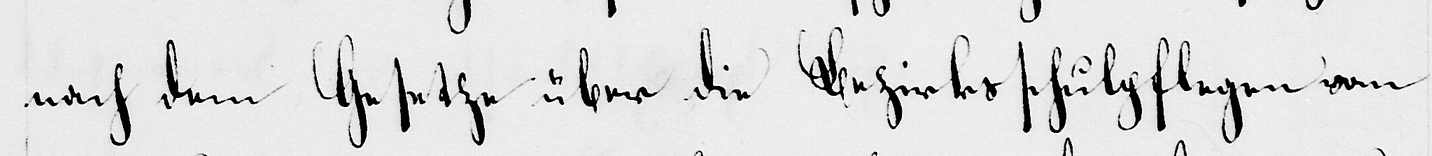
nach dem Gesetze über die Bezirksschulpflegen von
